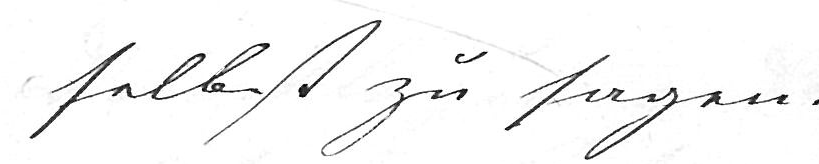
selbst zu sagen.
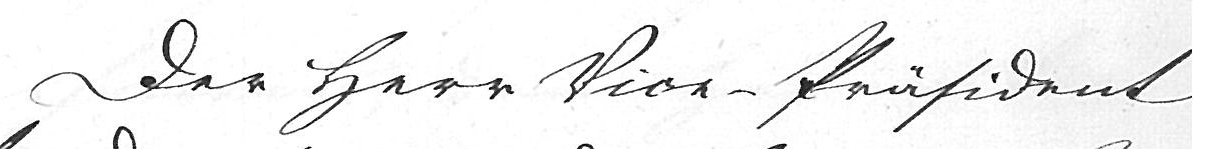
Der Herr Vice-Präsident
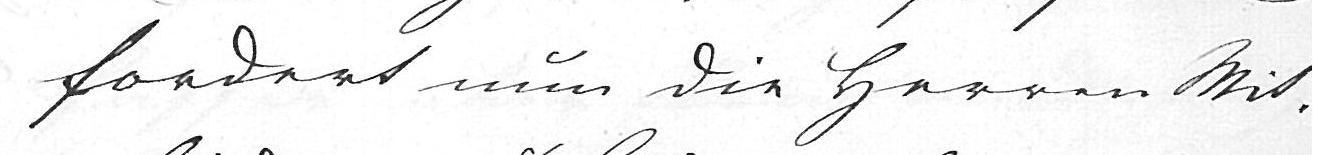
fordert nun die Herren Mit-
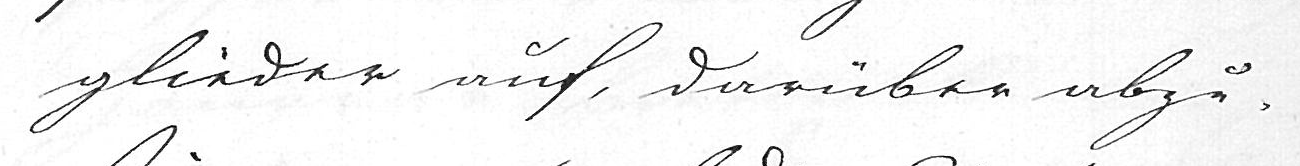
glieder auf, darüber abzu-
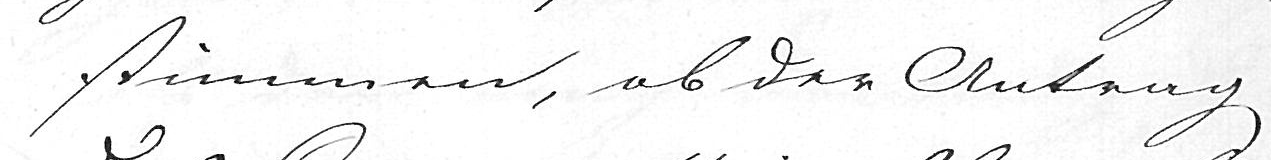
stimmen, ob der Antrag
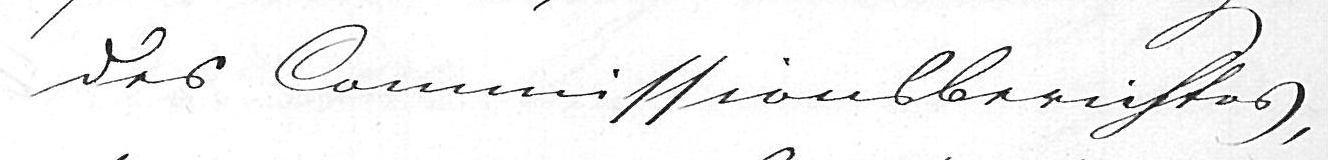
des Commissionsberichtes,
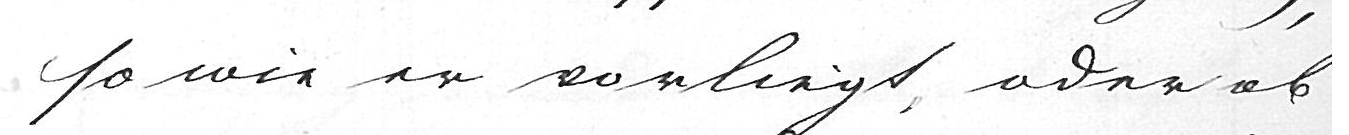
so wie er vorliegt, oder ob
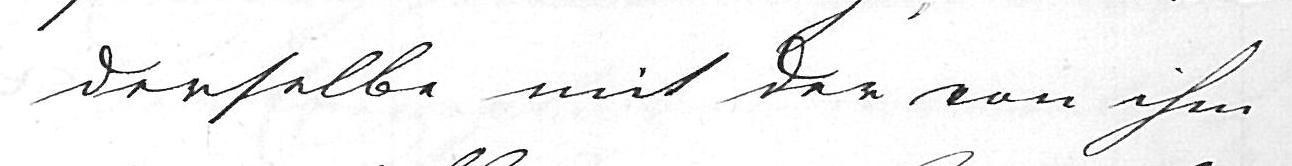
derselbe mit der von ihm
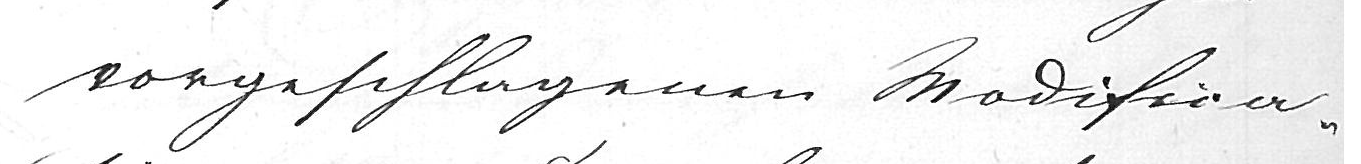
vorgeschlagenen Modifica-
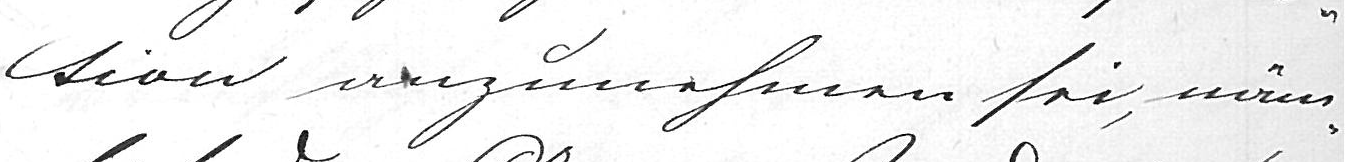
tion angenehmer sei, näm-
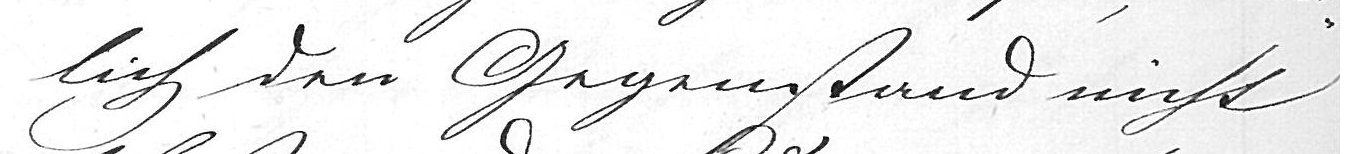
lich den Gegenstand nicht
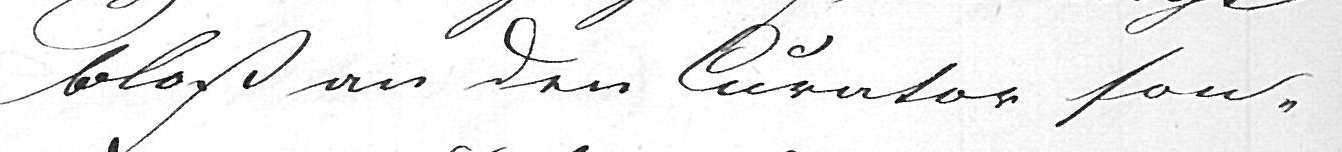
bloß an den Curator son-
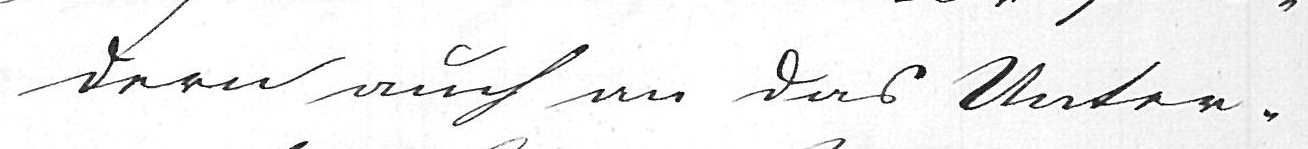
dern auch an das Unter-
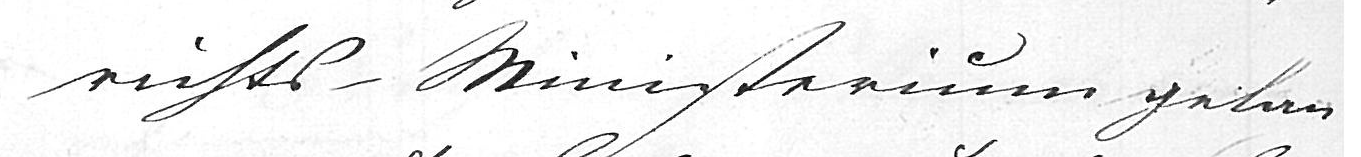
richts-Ministerium gelan-
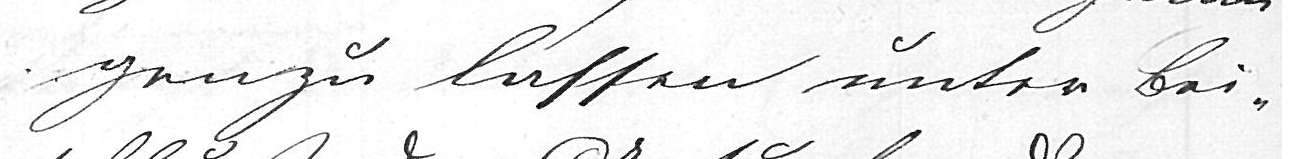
gen zu lassen unter Bei-
